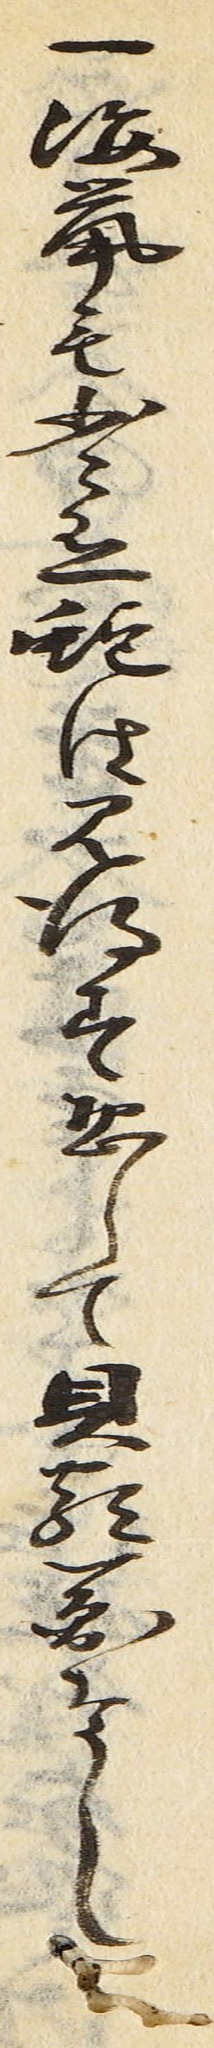一海鼠も少々有蚫は見得す惣して貝類一円なし
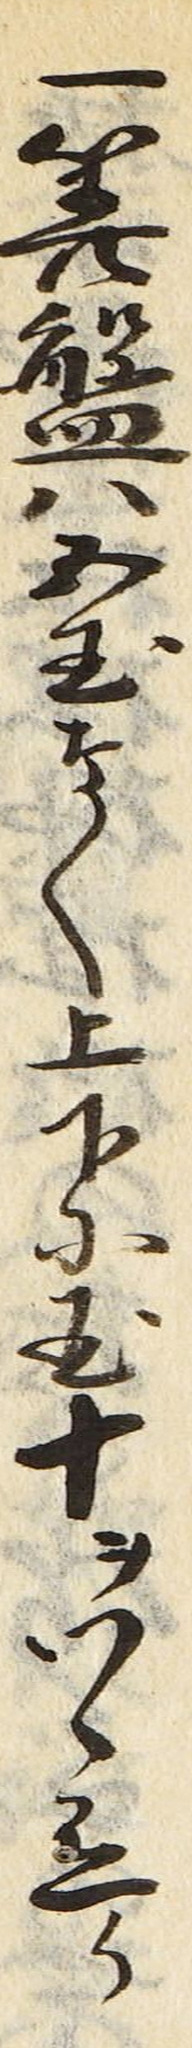一算盤は五玉なく上下玉十をつゝ有り
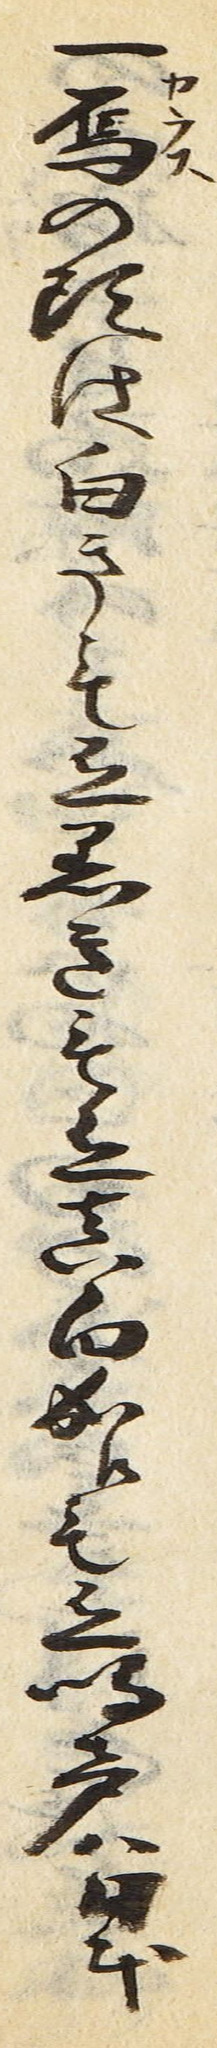一烏の頭は白きも有黒きも有真白成るも有鳴声は日本
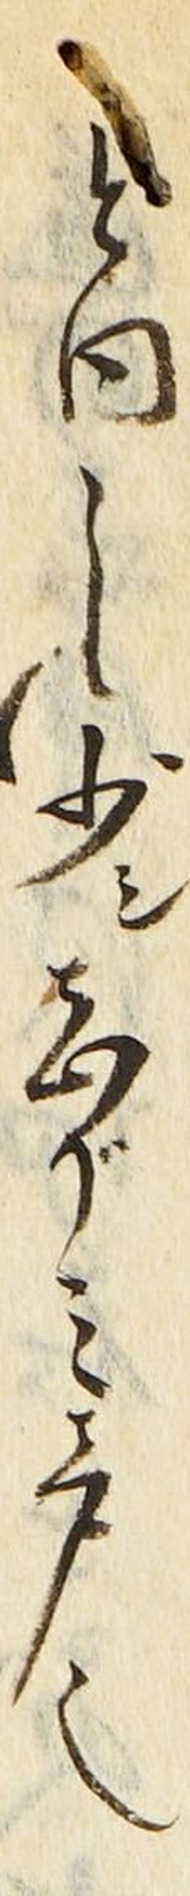と同し少ししがみ声也
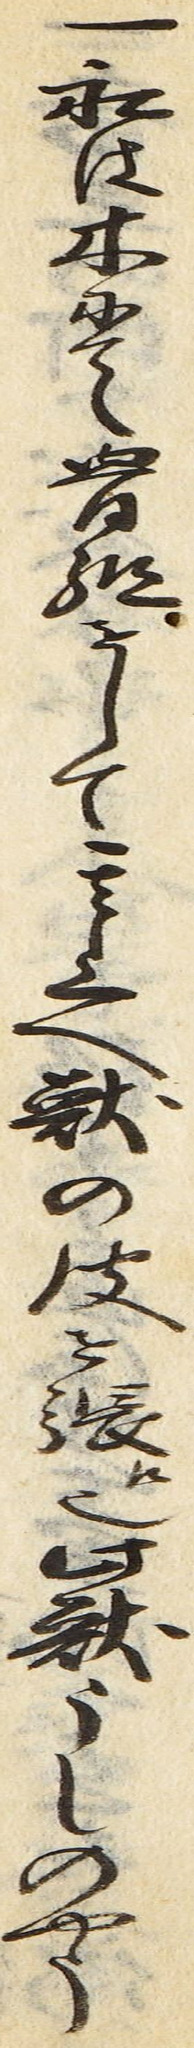一船は木にて骨組をして其上へ獣の皮を張る也此獣うしのやう
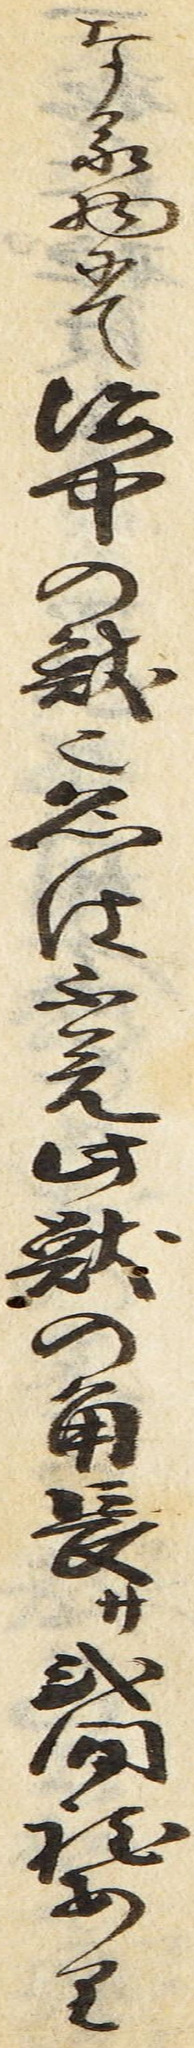なる物にて海中の獣也名は不覚此獣の角長さ弐間程あり
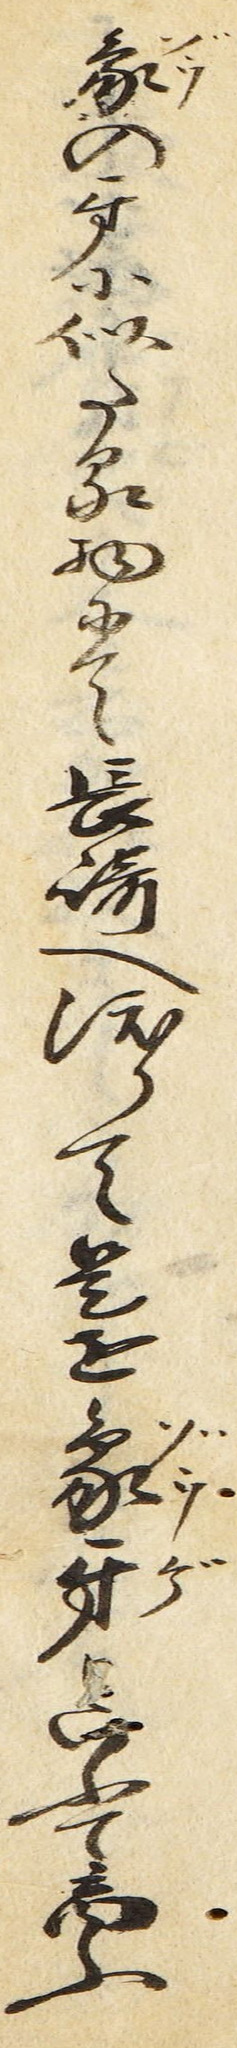象の牙に似たる物にて長崎へ渡りて是を象牙といふて商ふ

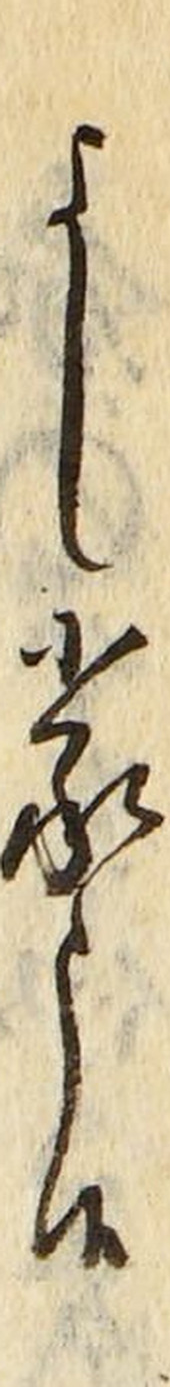よしに承申し候
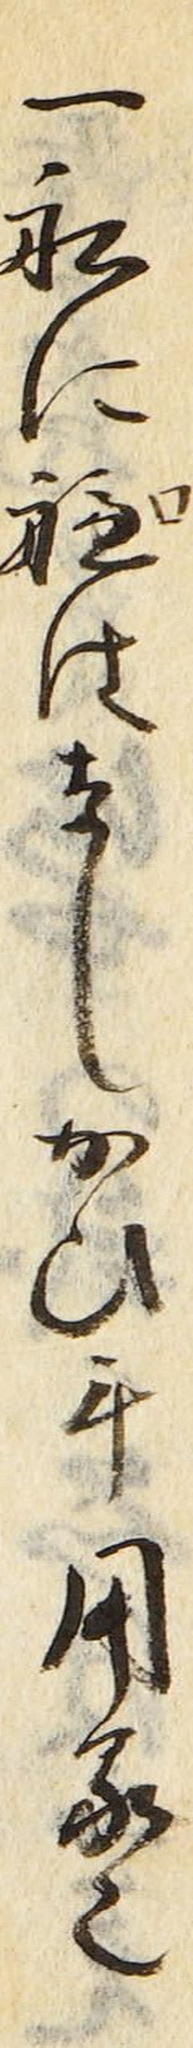一船に艪はなしかひ計用る也
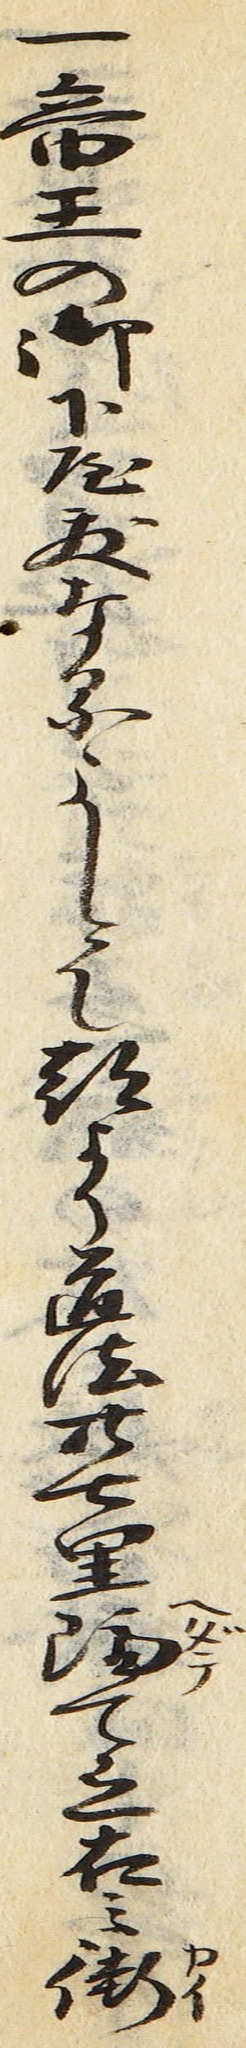一帝王の御下屋敷なるよしにて都より道法廿七里隔て有右之街
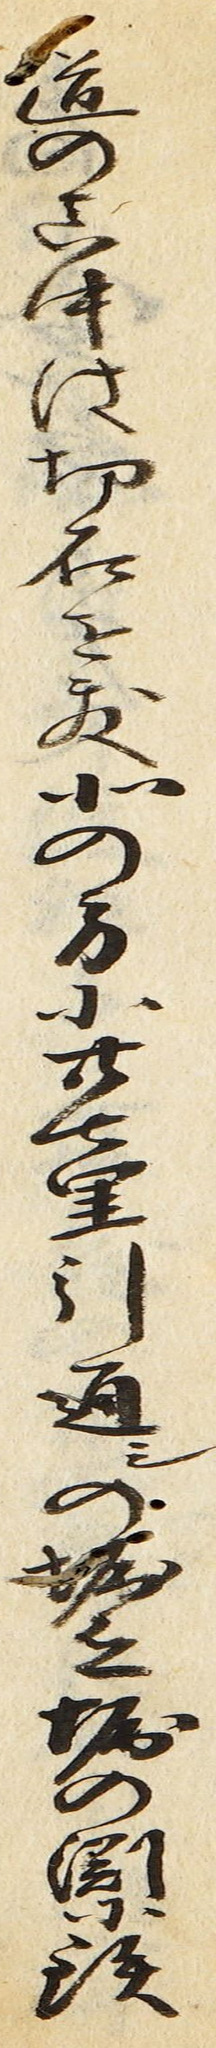道の真中は切石を敷き北の方に廿七里引通しの堀有堀の淵に鉄
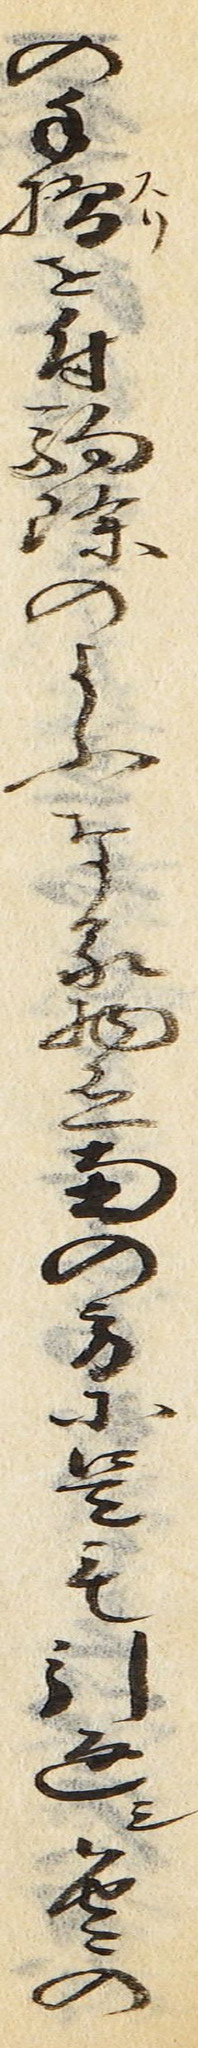の手摺付駒除のよふなる物有南の方に是も引通し色々の
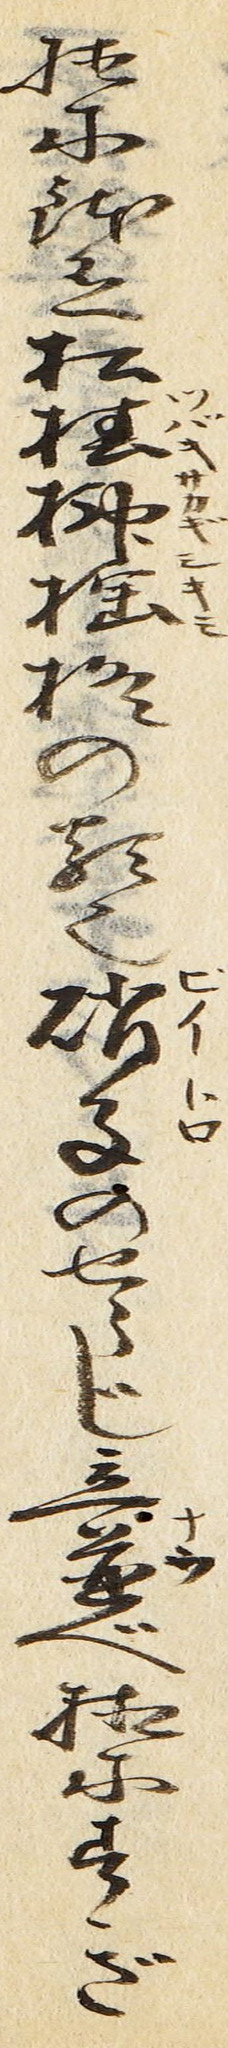植木鉢有松椿榊樒柊の類也硝子のせうじ立並べ植木すぎ
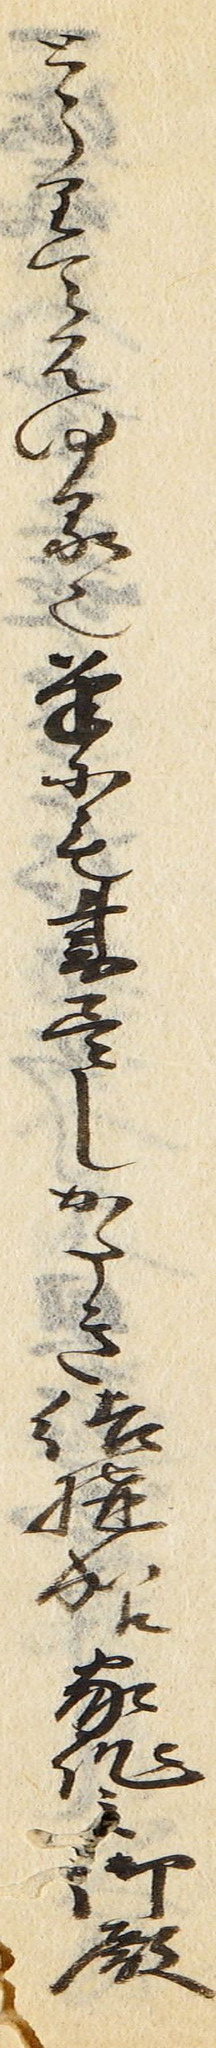とうりてはゆる筆にも書つくしかたき結構成る家作之御殿
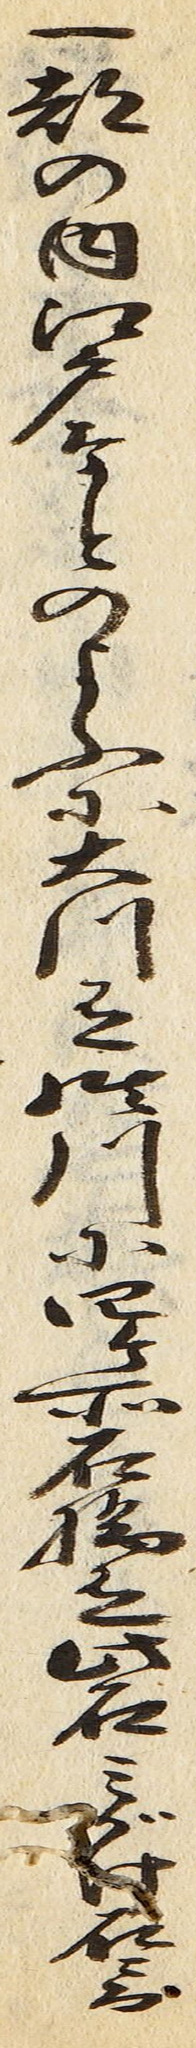一都の内江戸なとのよふに大川有此川に四ヶ所石橋有此石みがけ石に而
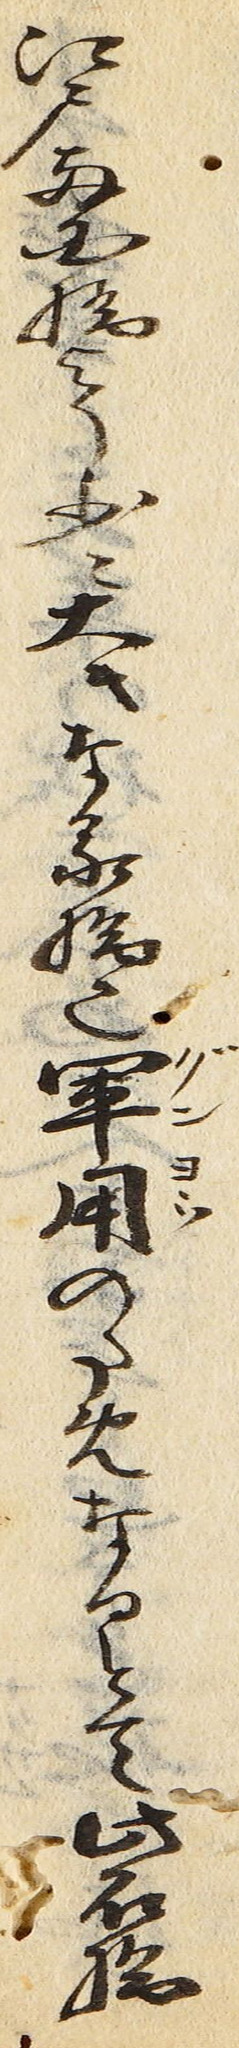江戸両国橋より少々大きなる橋也軍用のためなるとて此石橋
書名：外国漂流記
